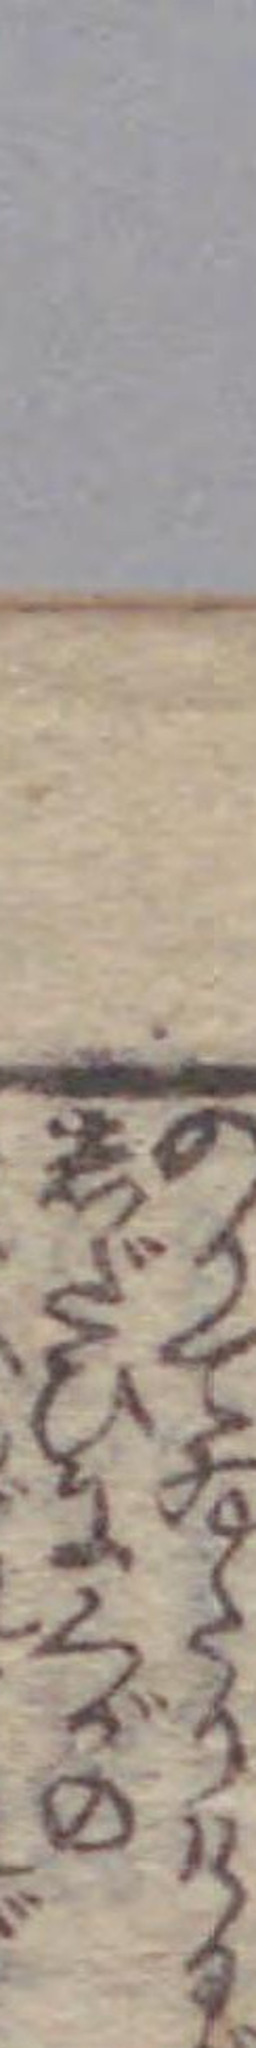しだひにくがの
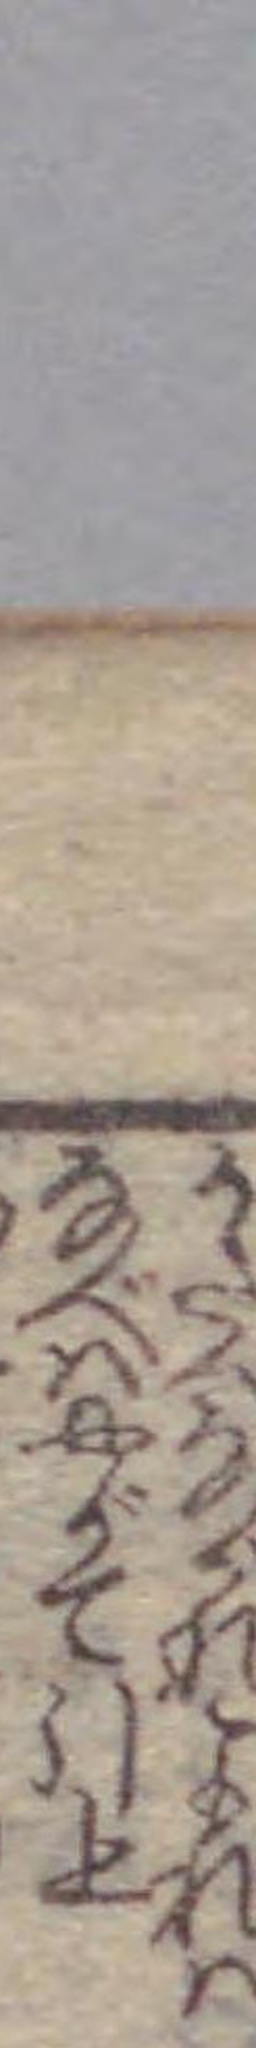なべはやがて引止
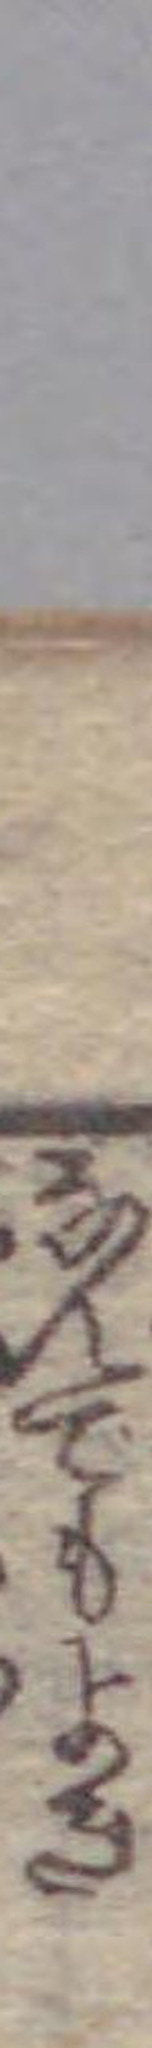なんでもよき
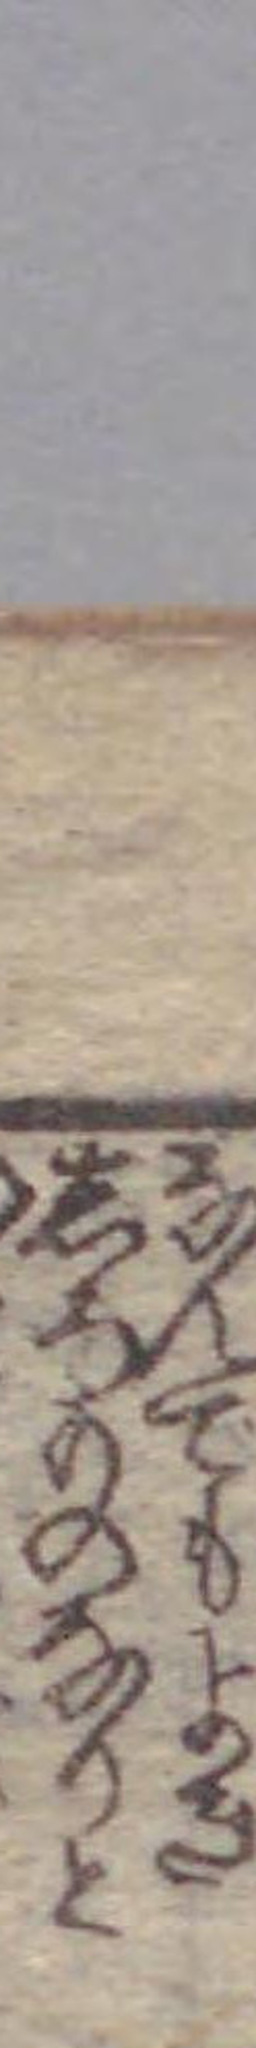しろものなりと
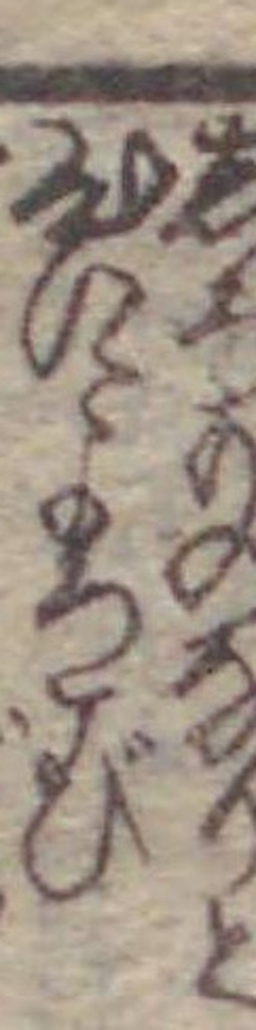心によろこび
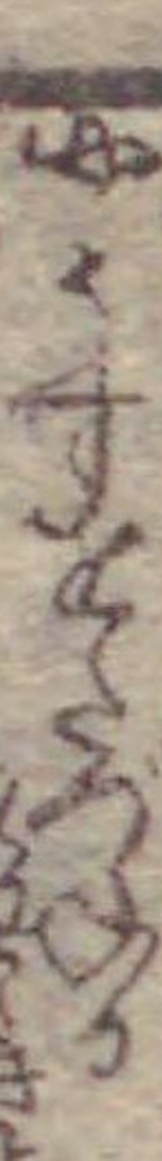やうすをたづねる
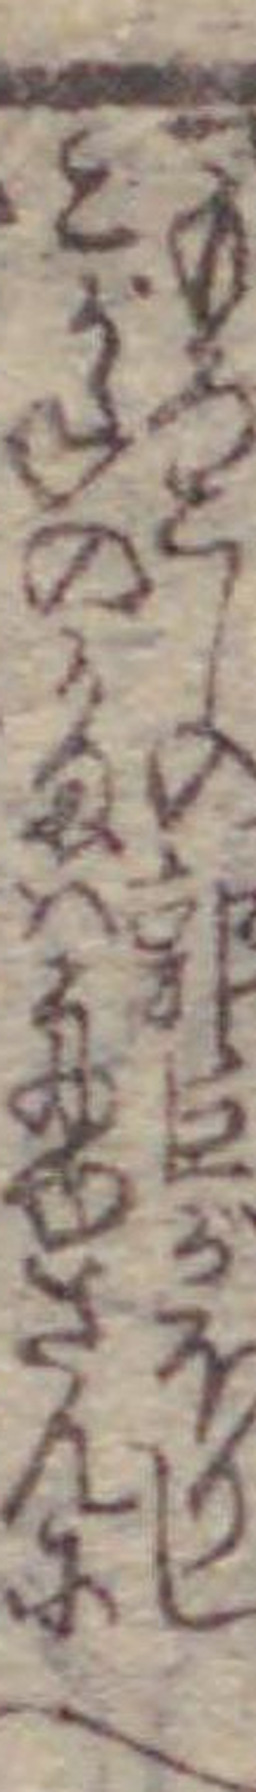こがねのかまは舟ゆさんに
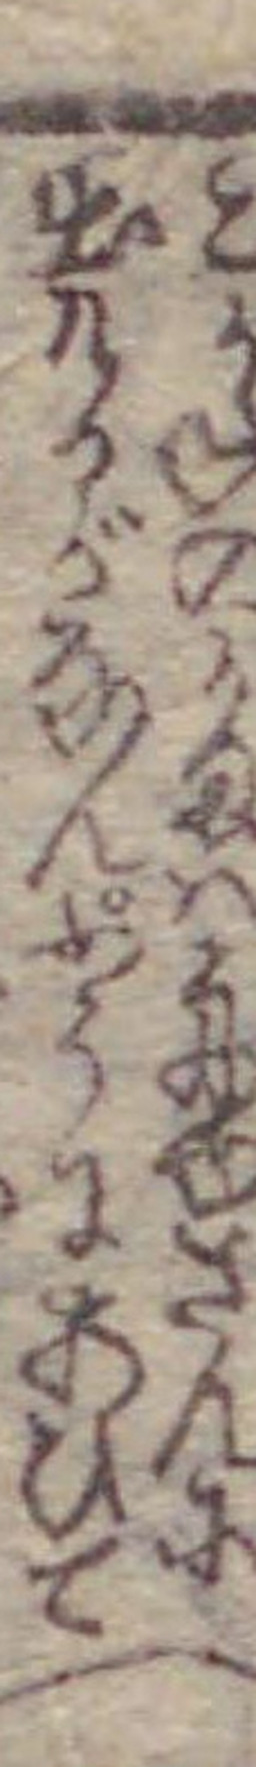出けるがなんぷうにあひて
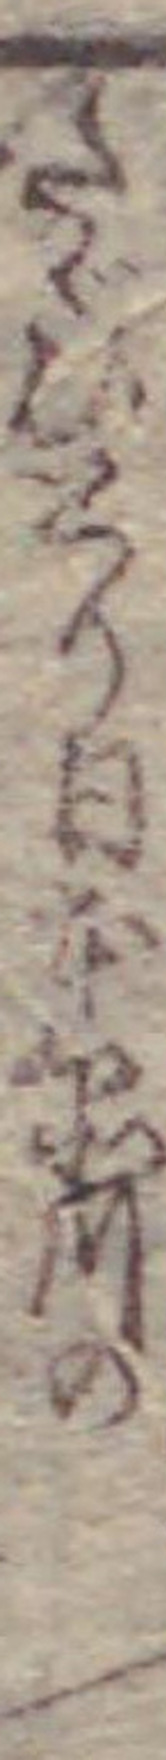たゞひとり日本品川の
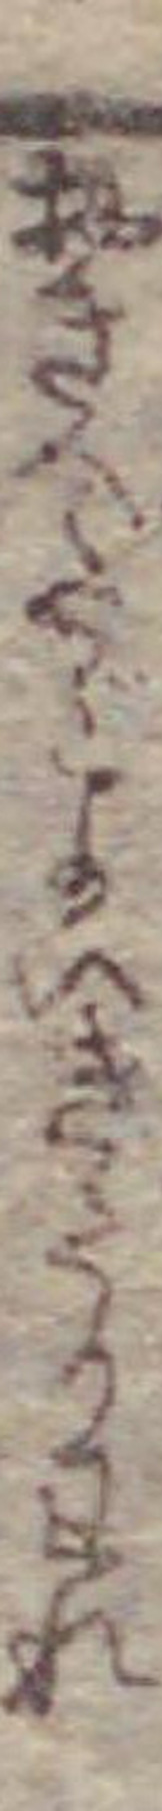おきへたゞよいきたりわれ
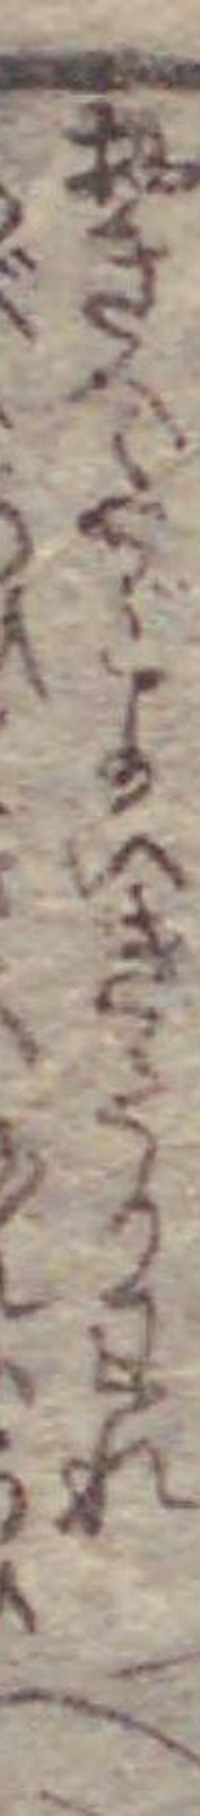おきへたゞよいきたりわれ
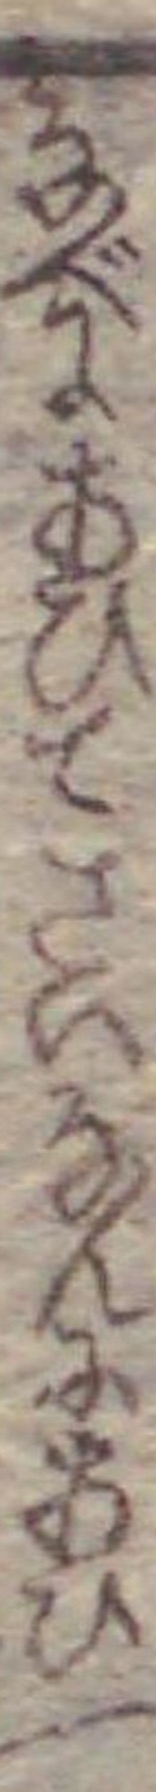なべにあひてさいなんにあひ
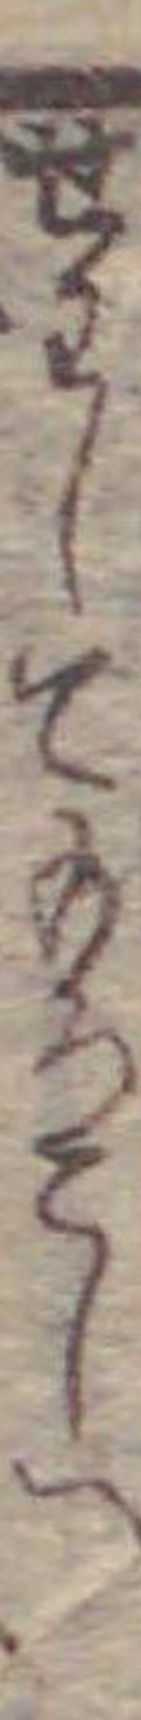せわしてもろこしへ
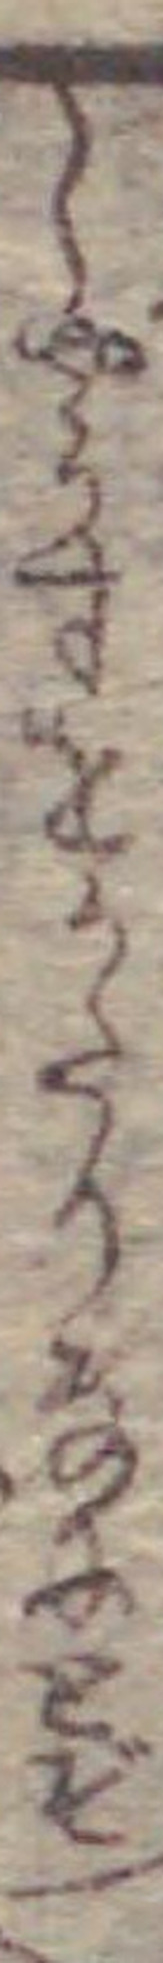しやうすをかたりなになにとぞ
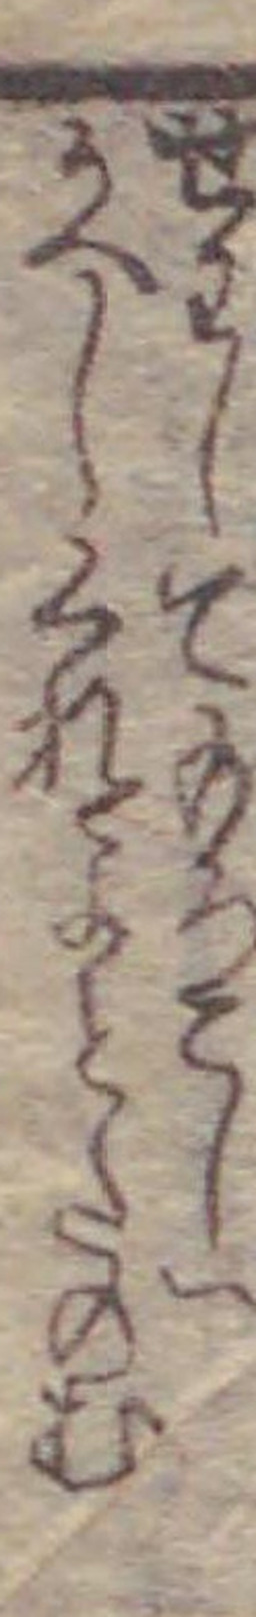かへしてくれよとたのむ

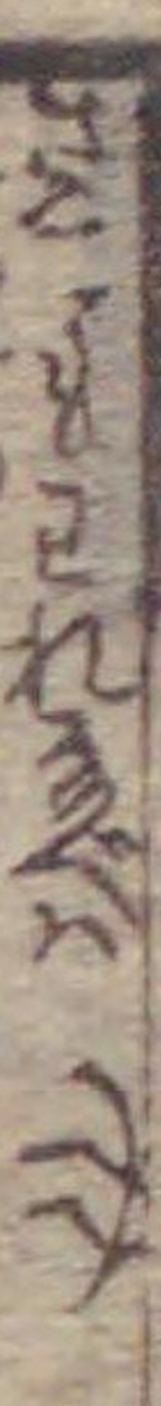さてもわれなべは
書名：万物小遣帳 : 2巻
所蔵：国立国会図書館 National Diet Library, JAPAN
